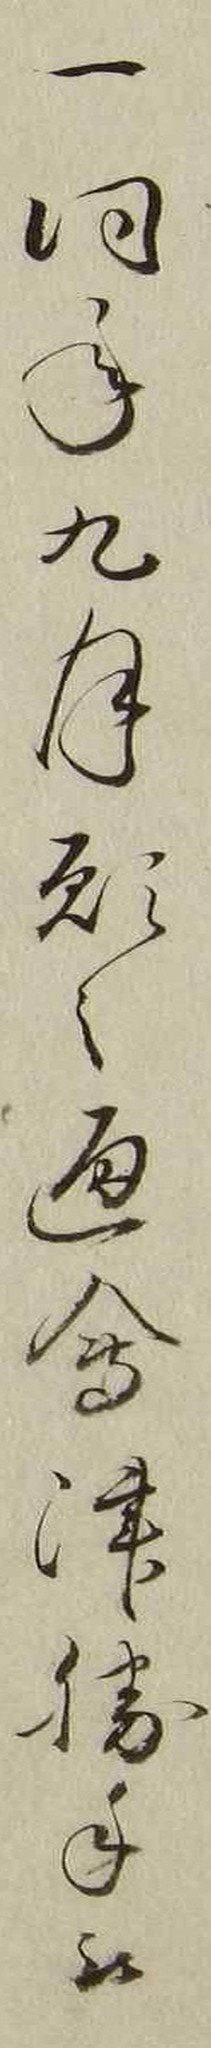一同年九月願之通会津勝手被
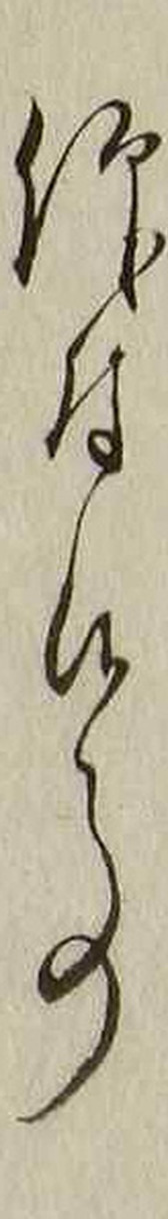仰付候事
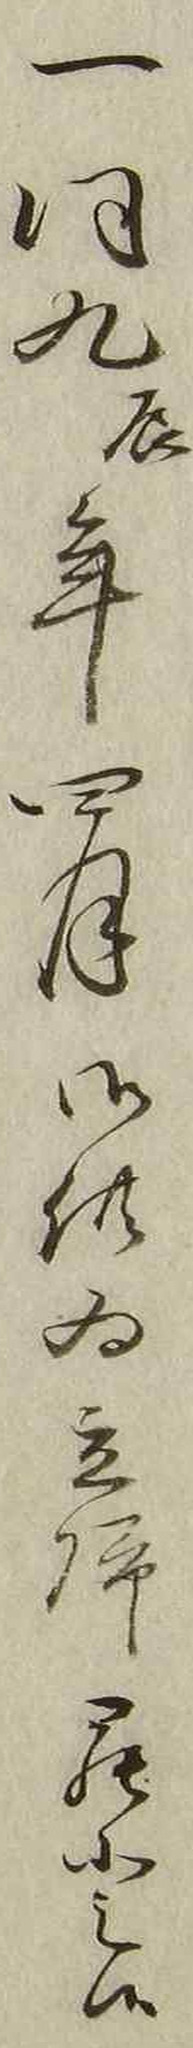一同九辰年四月御供為立帰罷登候
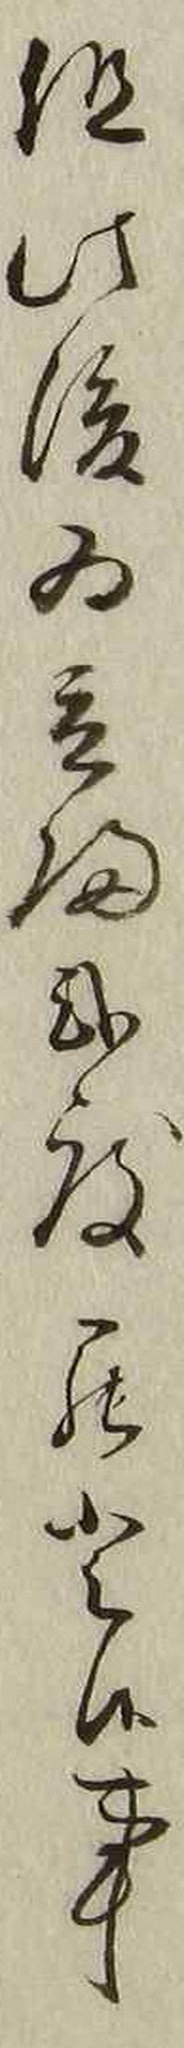但此後為立帰弐度罷登候事
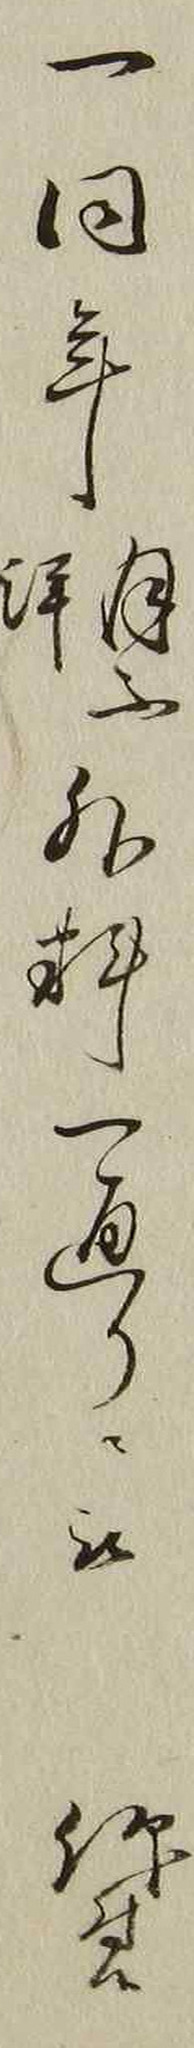一同年月不詳外料一通ニ被仰付候
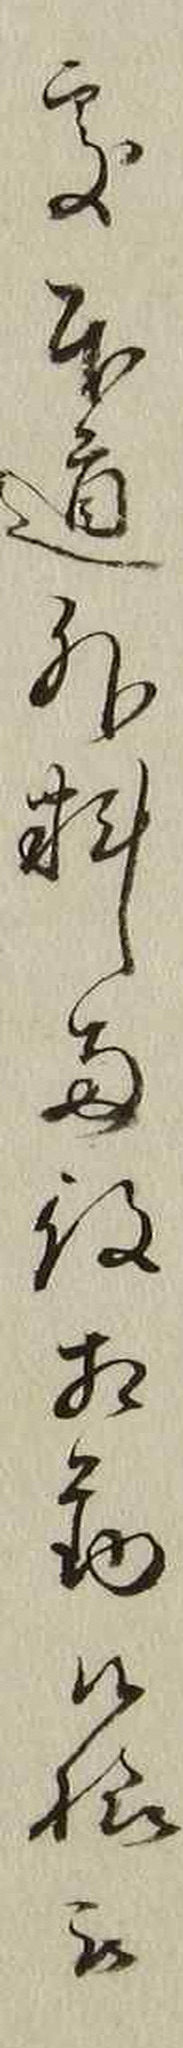処本道外料両役相勤候様
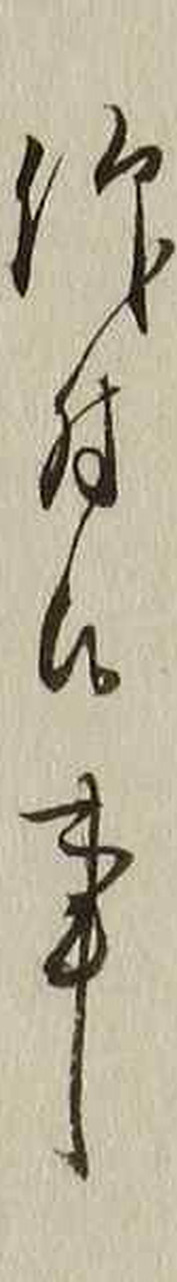仰付候事
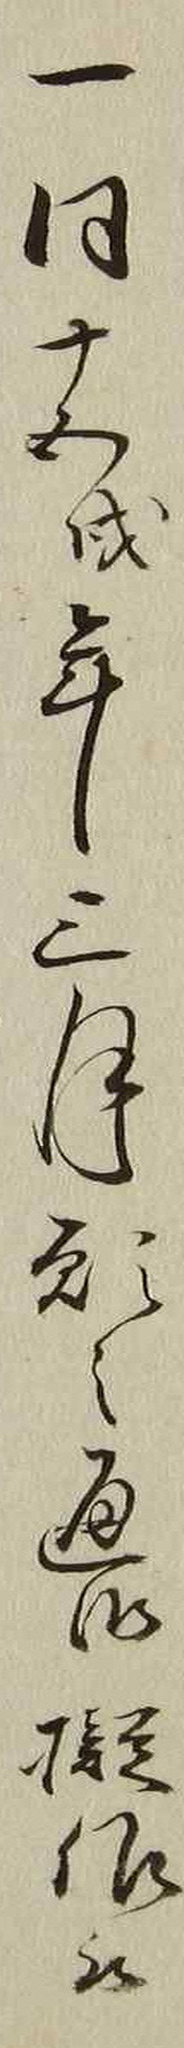一同十五戌年三月願之通御擬作被
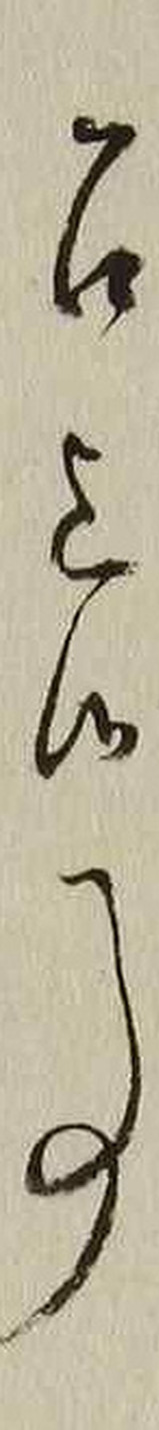召上候事
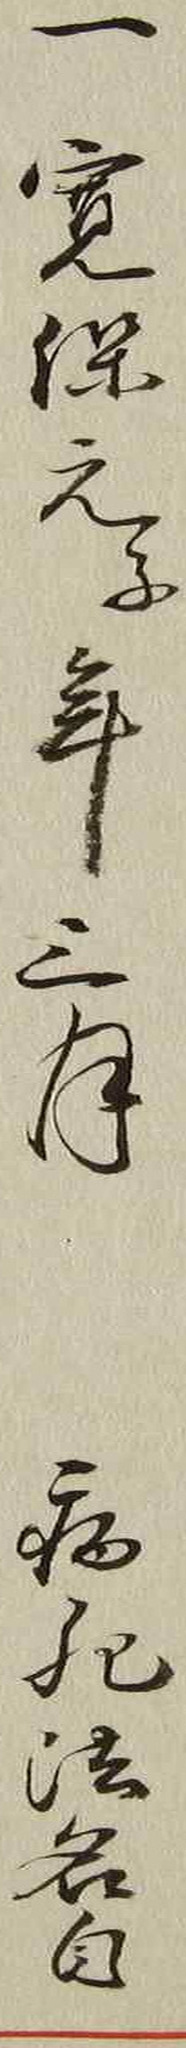一寛保元子年三月病死法名自
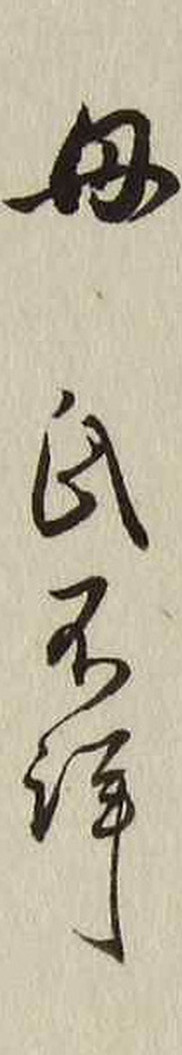母氏不詳
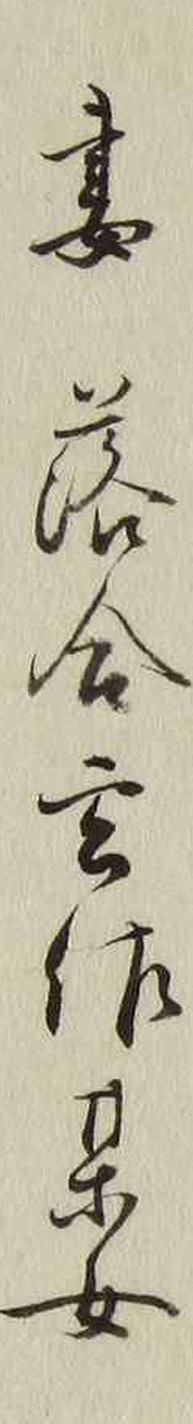妻落合玄作某女
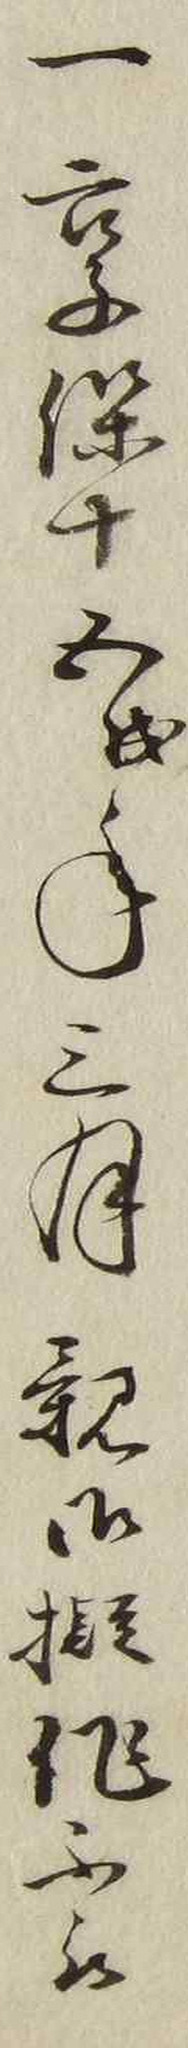一享保十五戌年三月親御擬作不被

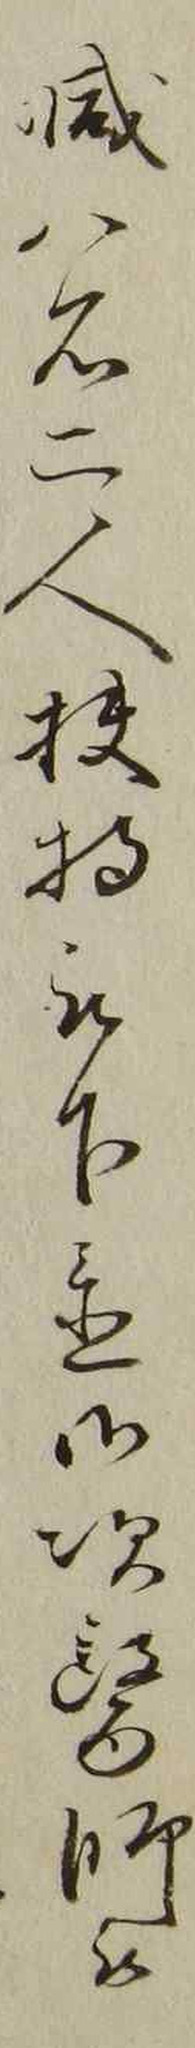減八石弐人扶持被下置御次医師被
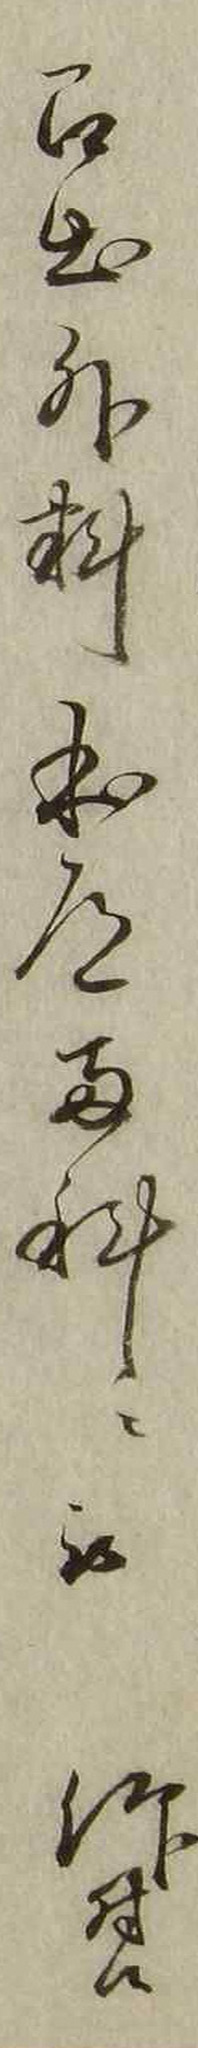召出外料本道両科ニ被仰付候
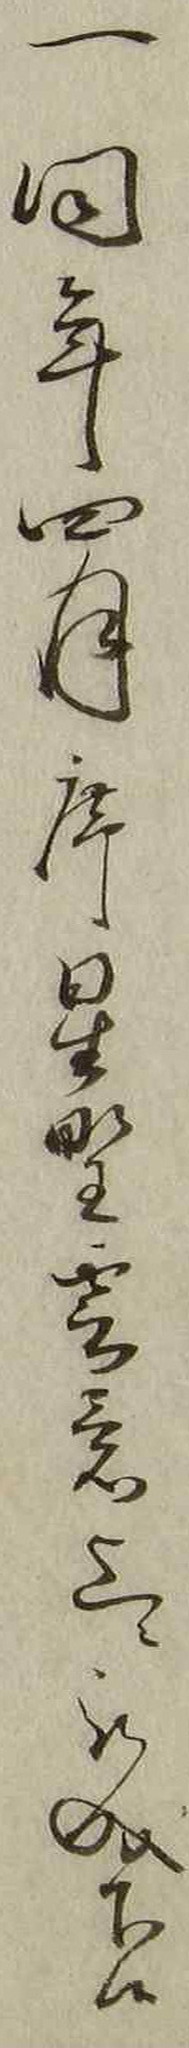一同年四月席星野雲意上ニ被成下候
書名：諸士系譜　巻之8　い之部8
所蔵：会津若松市立会津図書館
